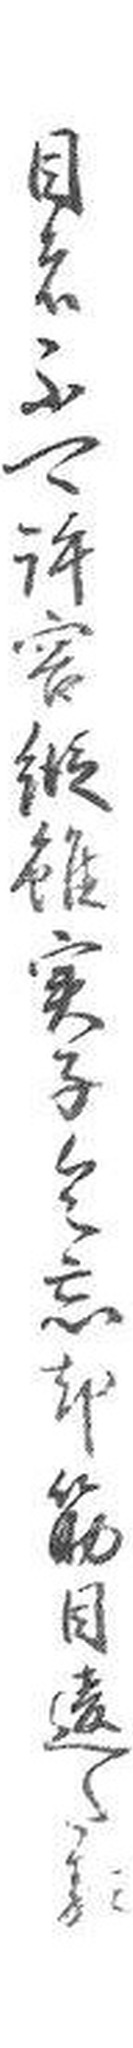目者不可許容縦雖実子令忘却筋目違たる
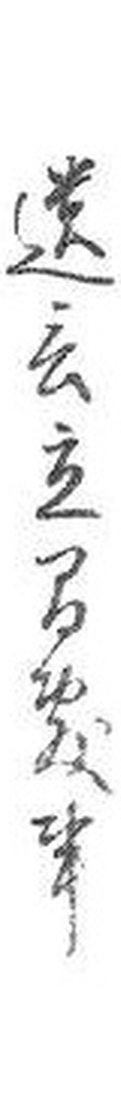遺言立間敷事
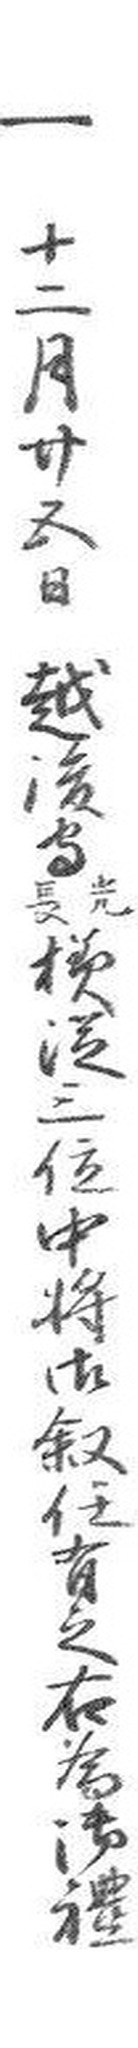一十二月廿五日越後守光長様従三位中将御叙任有之為右御礼
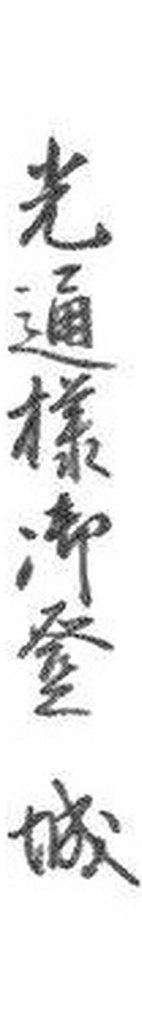光通様御登城
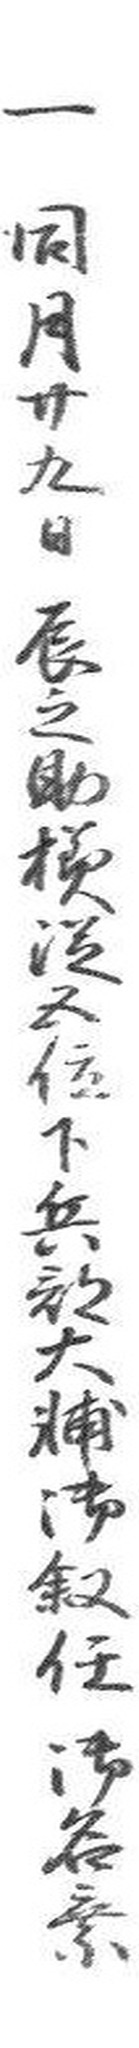一同月廿九日辰之助様従五位下兵部大輔御叙任御名乗
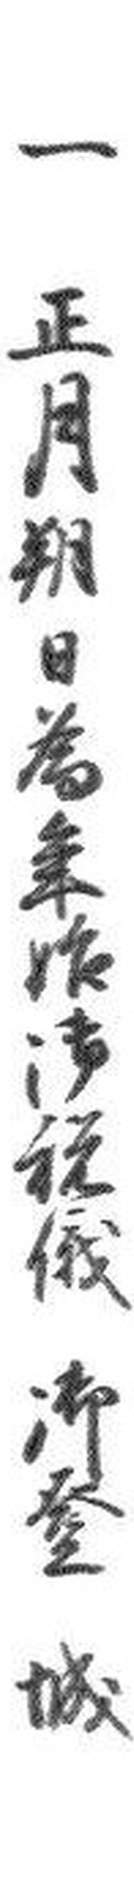一正月朔日為年始御祝儀御登城
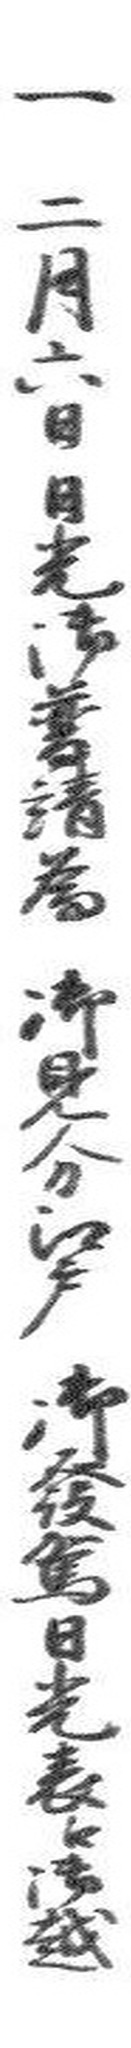一二月六日日光御普請為御見分江戸御発駕日光表江御越
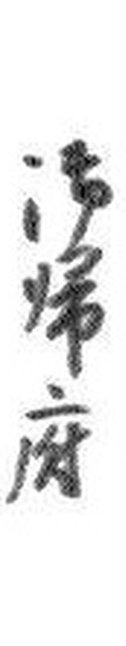御帰府
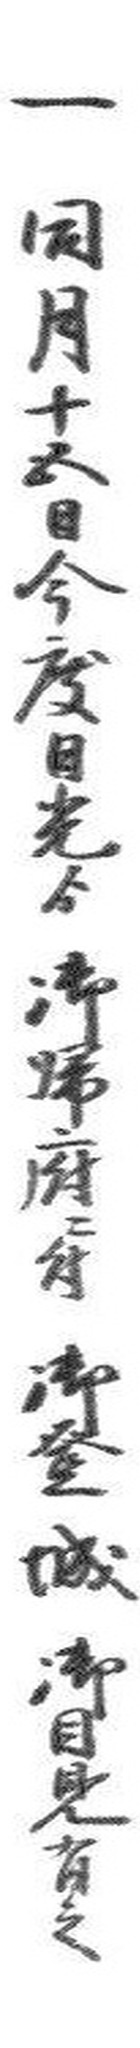一同月十五日今度日光ゟ御帰府ニ付御登城御目見有之
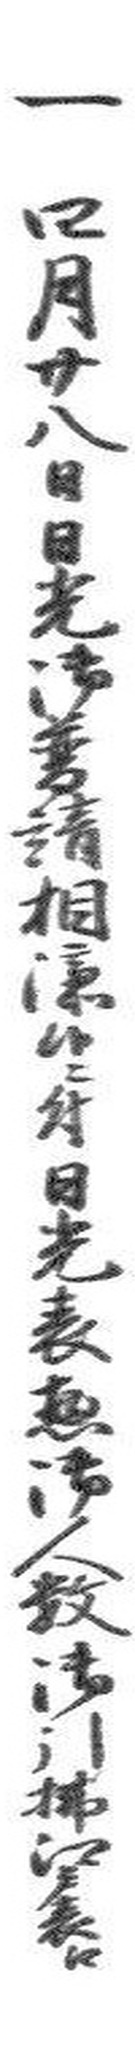一四月廿八日日光御普請相済候ニ付日光表惣御人数御引払江戸表江

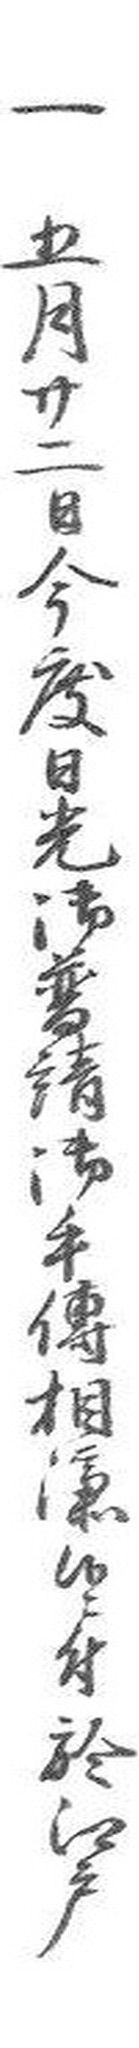一五月廿二日今度日光御普請御手伝相済候ニ付於同江戸
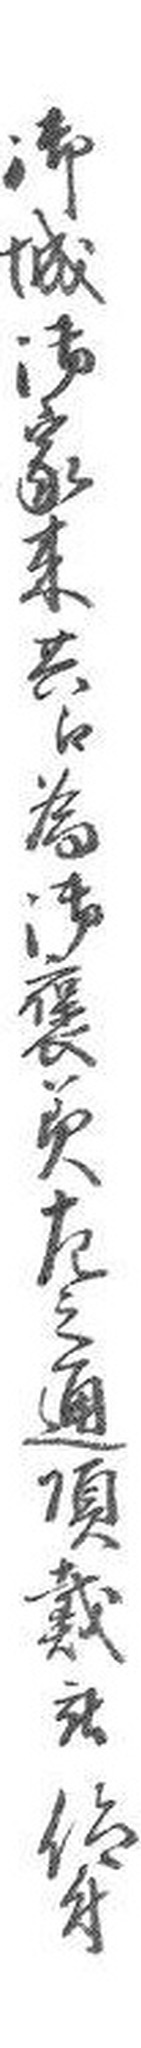御城御家来共江為御褒美左之通頂戴被仰付
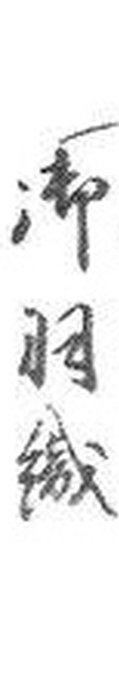御羽織
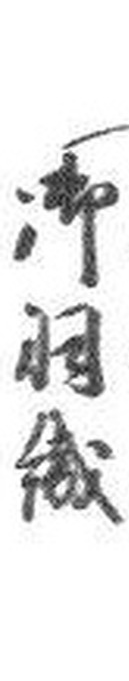御羽織
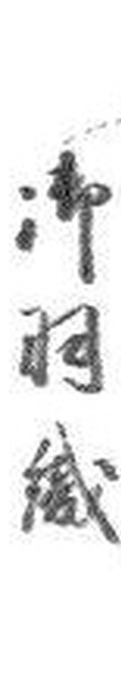御羽織
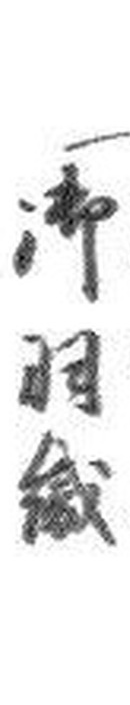御羽織
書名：家譜 五 光通公 従寛永十三年到万治二年
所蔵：福井県文書館 Fukui Prefectural Archives
